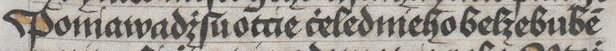Poniawadż ſu otcie ċeledníeho belzebubē
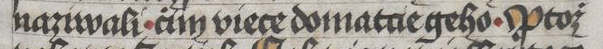nazwali.ċím víece domatcie geho.Ꝓtoż
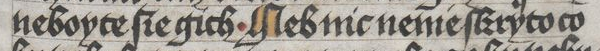neboyte ſie gich.Neb nic neníe ſkryto co¬
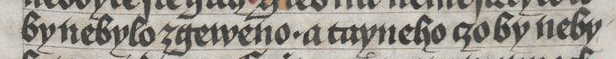by nebylo zgeweno.a tayneho czo by neby¬
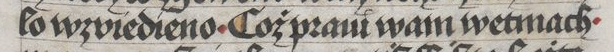lo wzviedíeno.Coż praui wam wetmach.
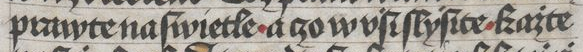prawte naſwíetle.a czo w vẛi ſlyẛite.każte
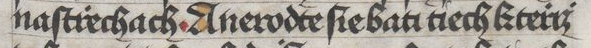naſtṙechach.Anerodte ſie bati tiech kteṙiż
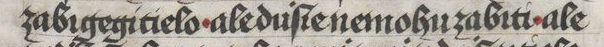zabi gegí tielo.ale duẛie nemohu zabiti.ale
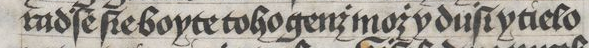radẛe ſie boyte toho genż moż y duẛi y tielo
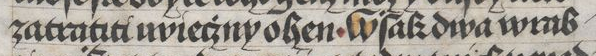zatratiti uviecżny ohen.Wẛak dwa wrab¬
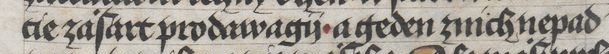cie zaẛart prodawagij.a geden zních nepad¬
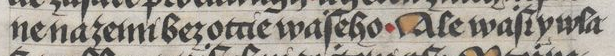ne na zemi bez otcie waẛeho.Ale waẛi y wla¬
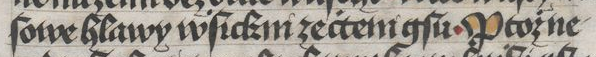ſowe hlawy wẛickni ze ċteni gſu.Ꝓtoż ne¬
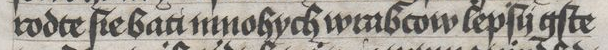rodte ſie bati mnohych wrabcow lepẛij gſte
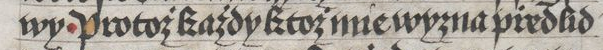wy.Protoż każdy ktoż mie wyzna predlid¬
